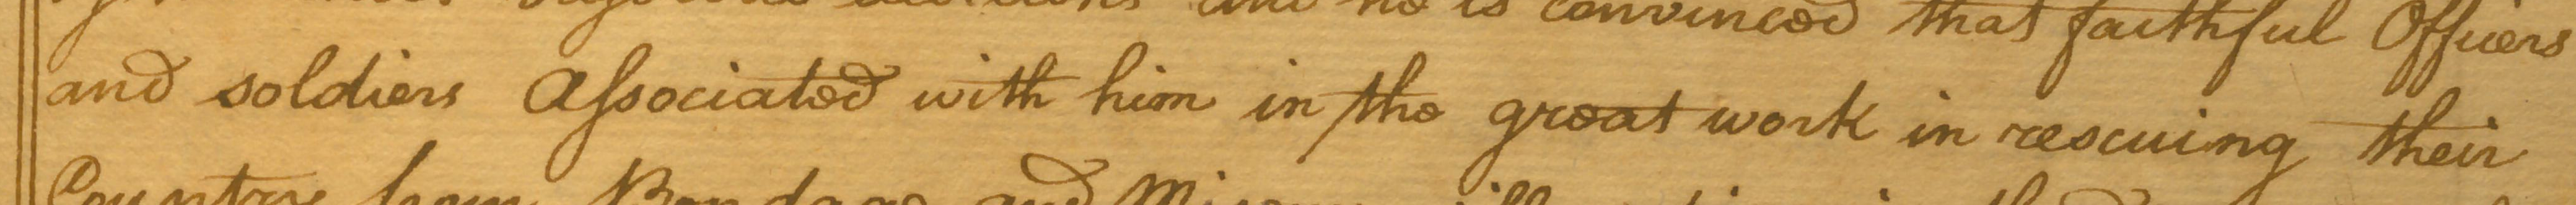and soldiers Associated with him in the great work in rescuing their
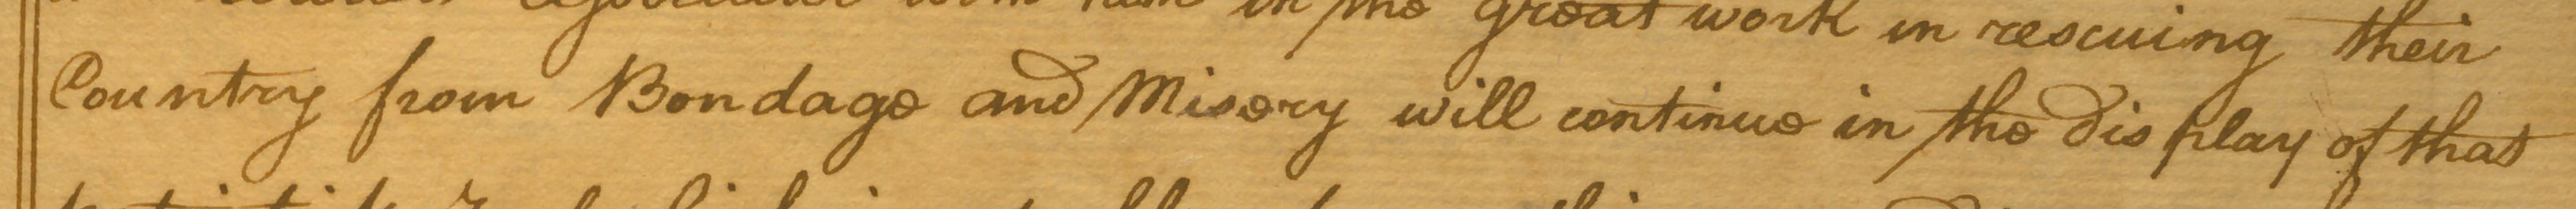Country from Bondage and Misery will continue in the display of that
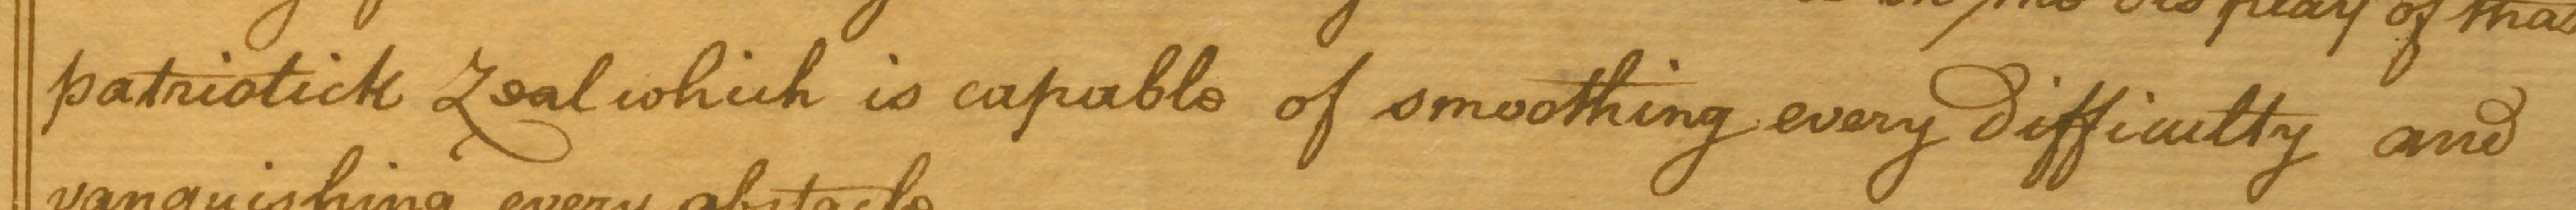patriotick Zeal which is capable of smoothing every difficulty and
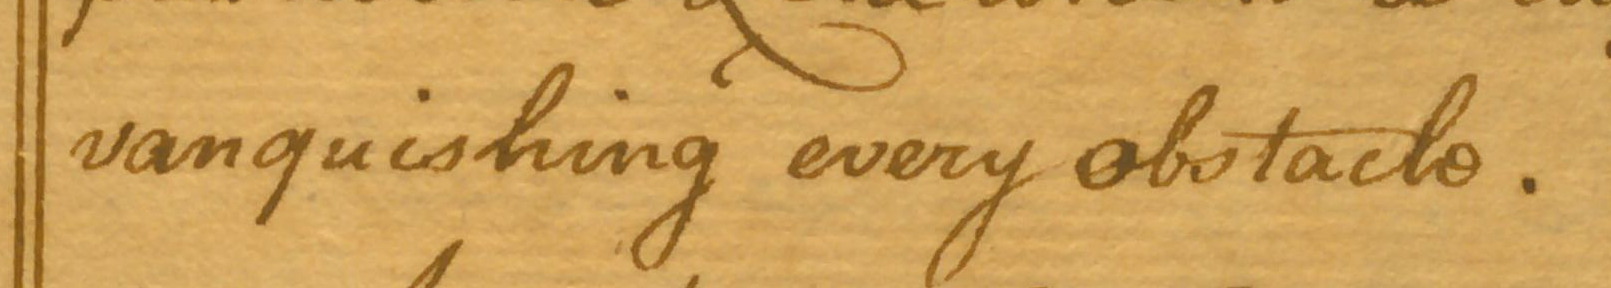vanquishing every obstacle.
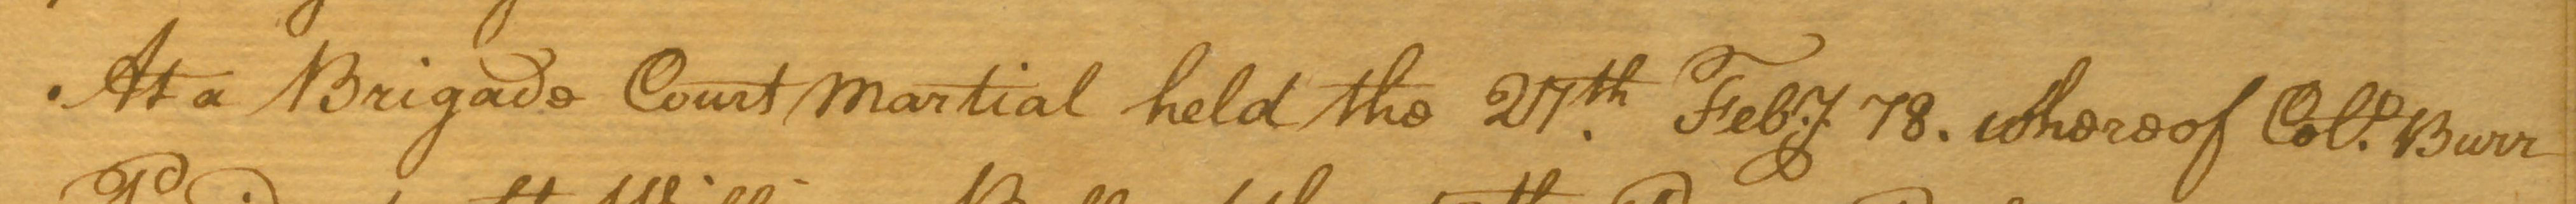At a Brigade Court Martial held the 27^th. Feb^y. 78. whereof Col^o. Burr
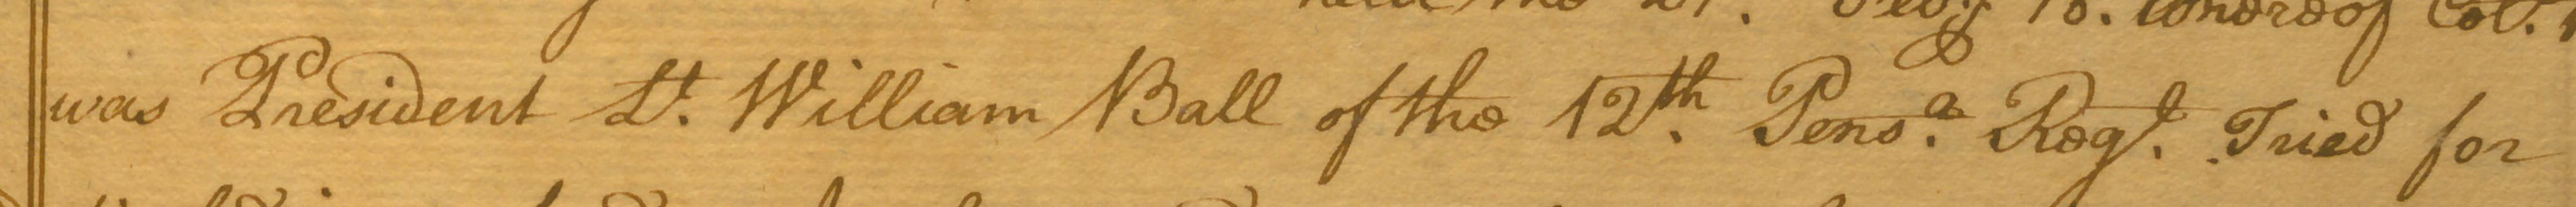was President L^t. William Ball of the 12^th. Pens^a. Reg^t. Tried for
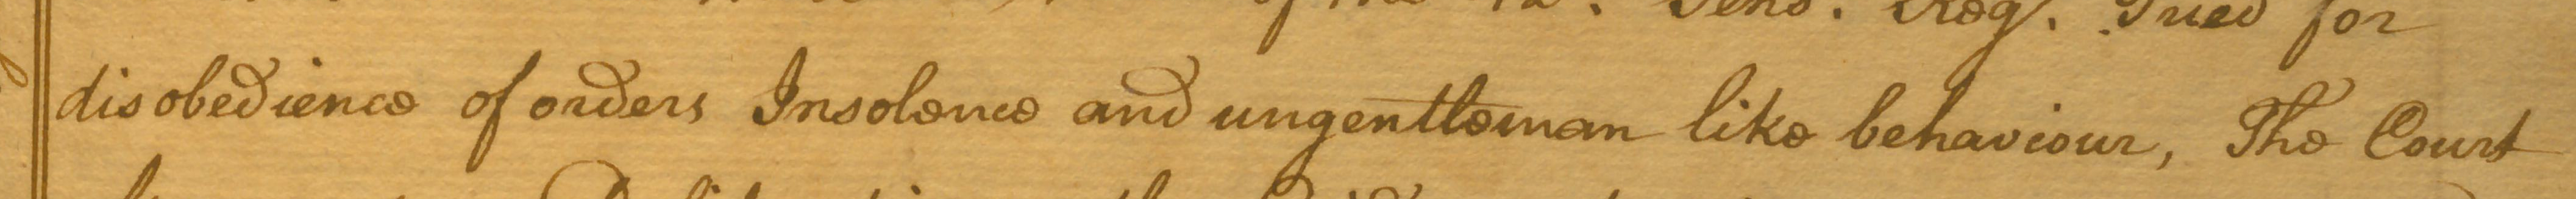disobedience of orders Insolence and ungentlemen like behaviour, The Court
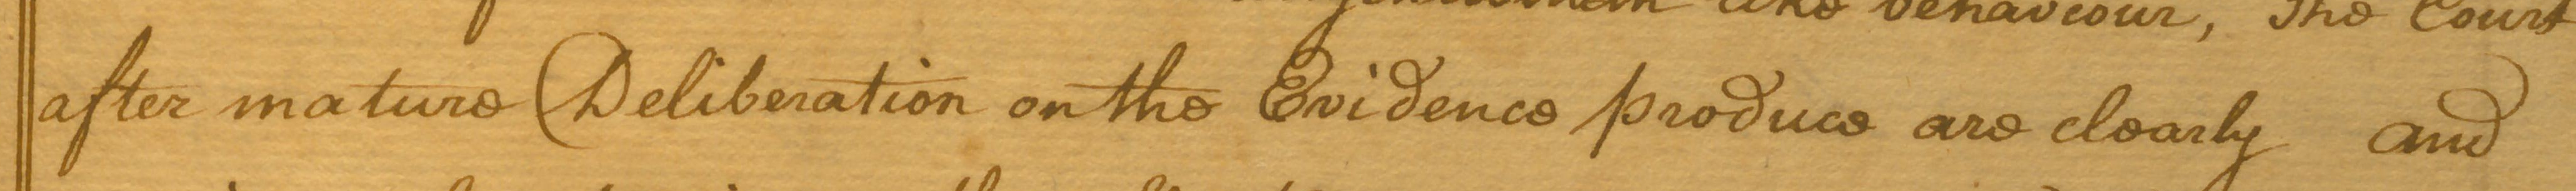after mature Deliberation on the Evidence produce are clearly and
